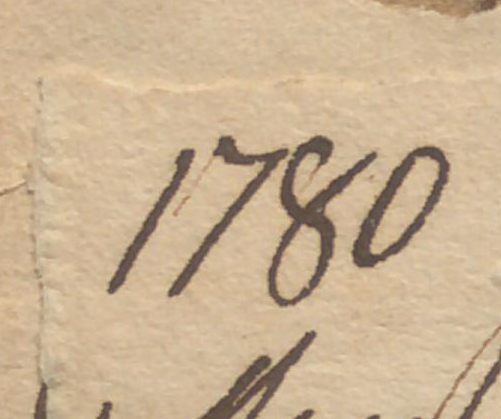1780
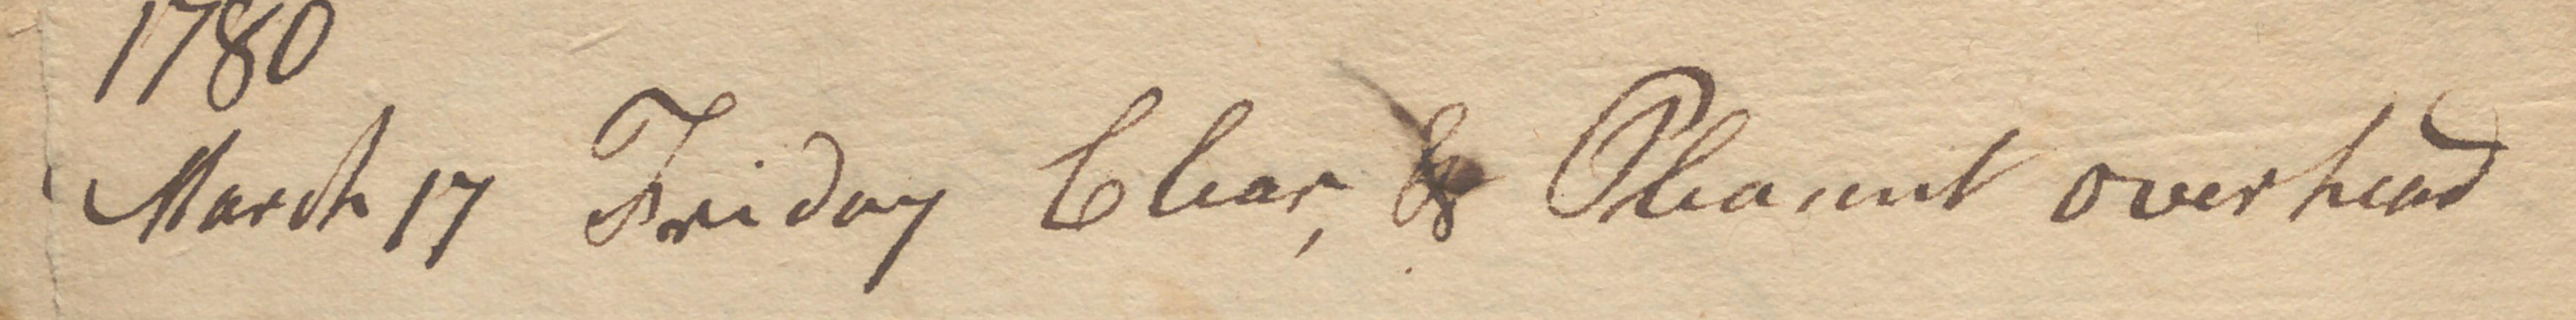March 17 Friday Clear & Pleasent over head
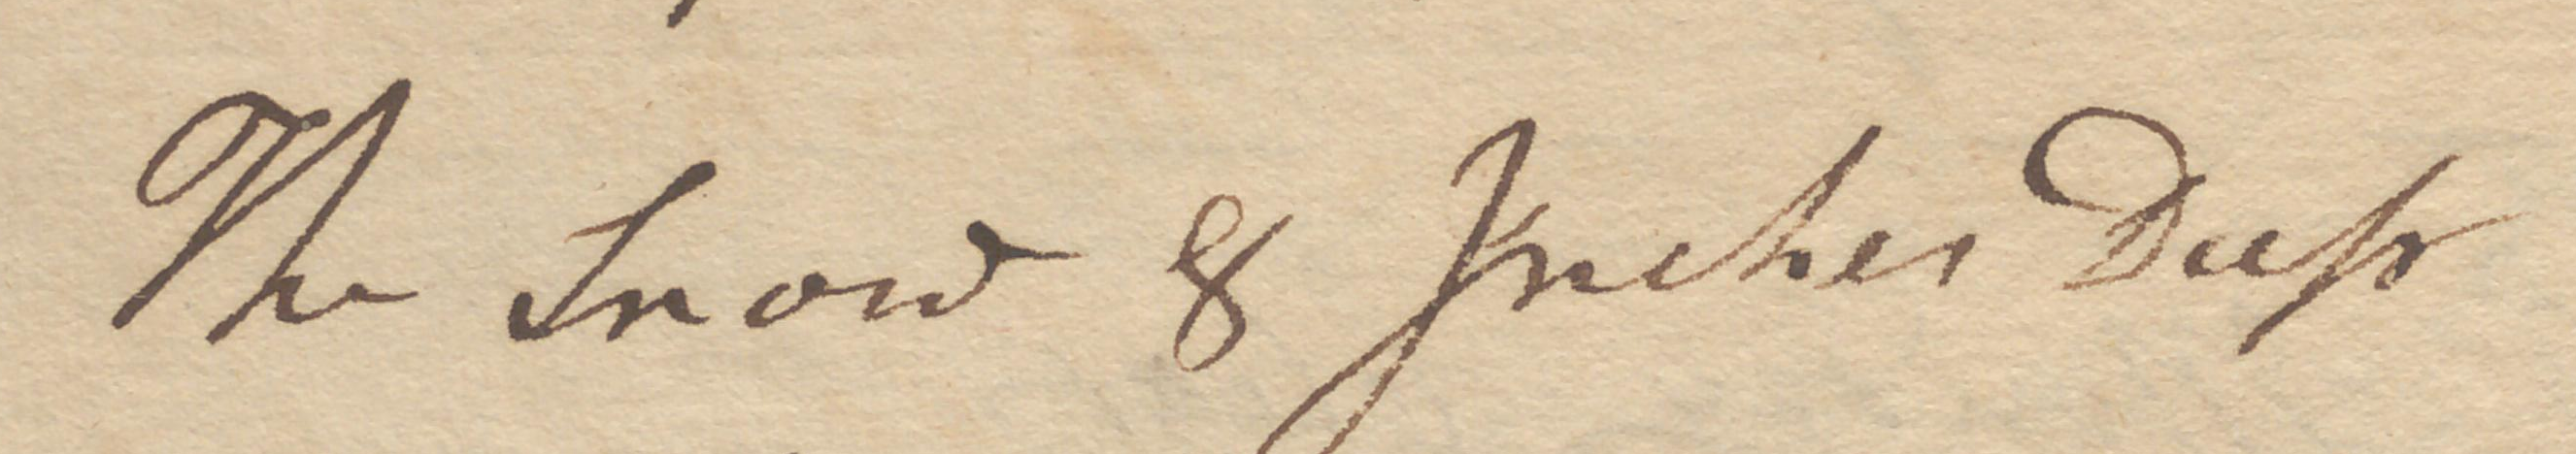The snow 8 Inches Deep
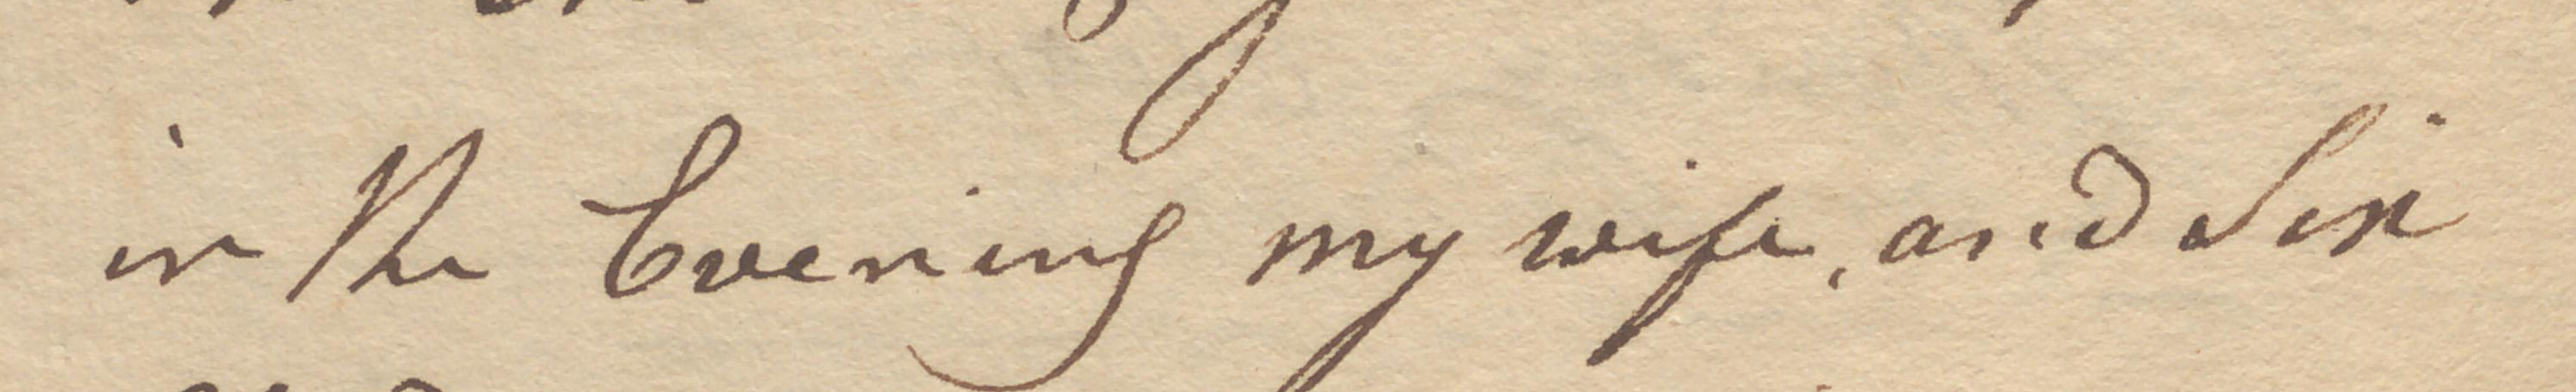in the Evening my wife, and Six
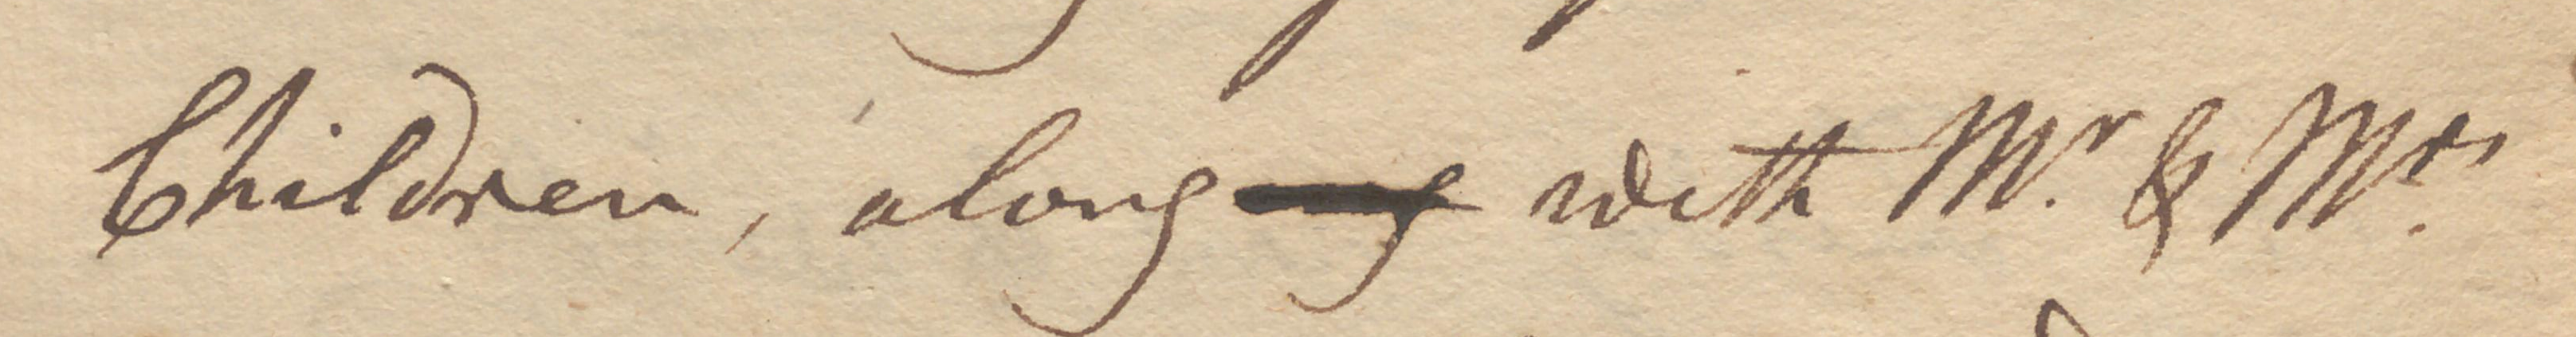Children, along[ing] with M^r. & M^rs.
